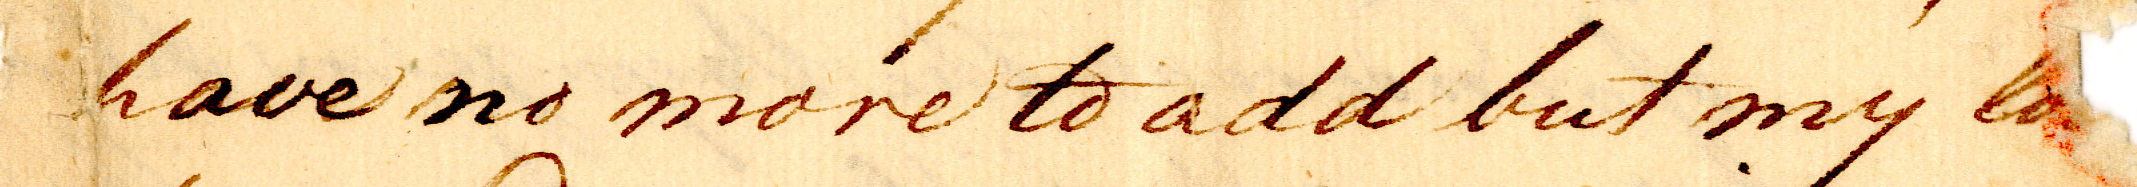have no more to add but my lo[_]
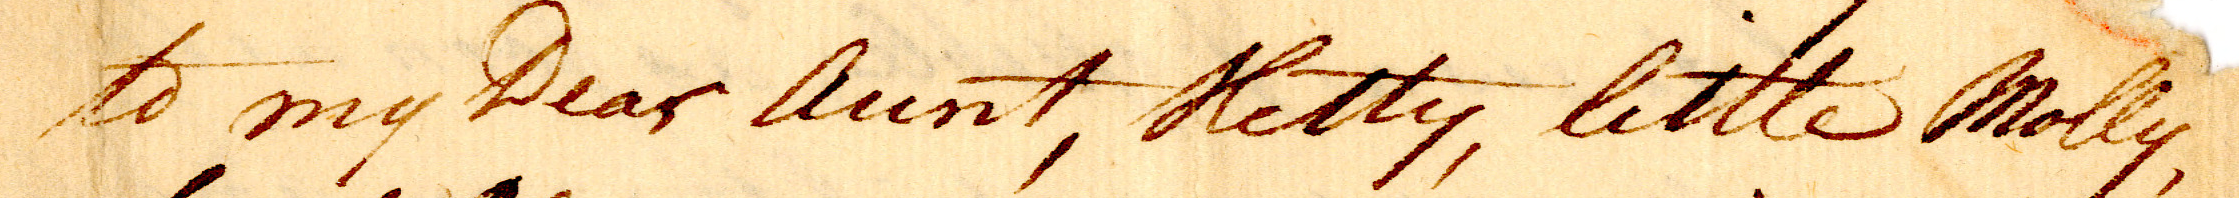to my Dear Aunt, Hetty, little Molly,
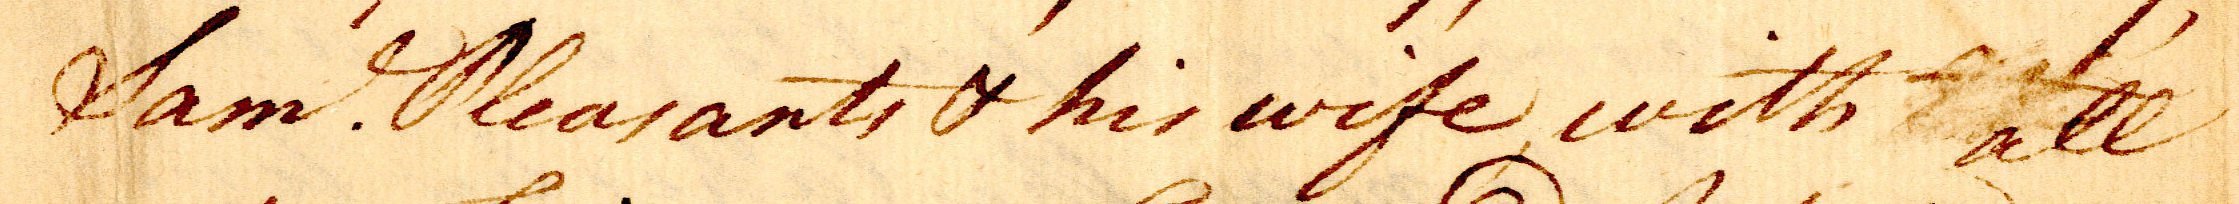Sam^l. Pleasants & his wife, with all
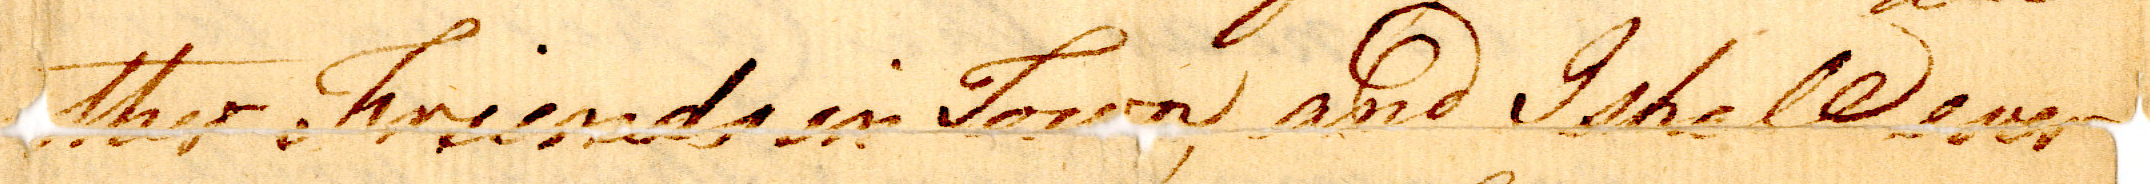thy Friends in Town, and I shall ever
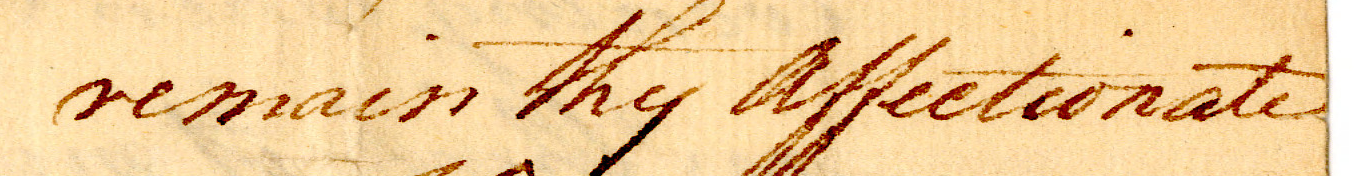remain thy affectionate
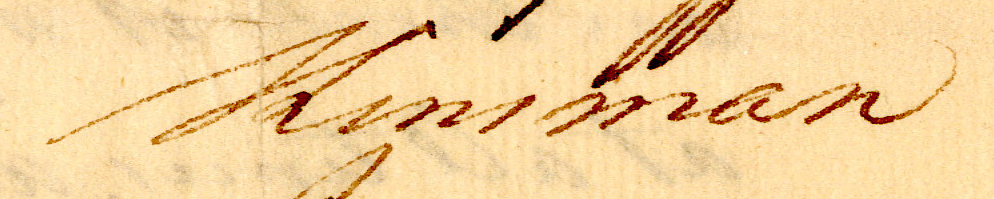Kinsman
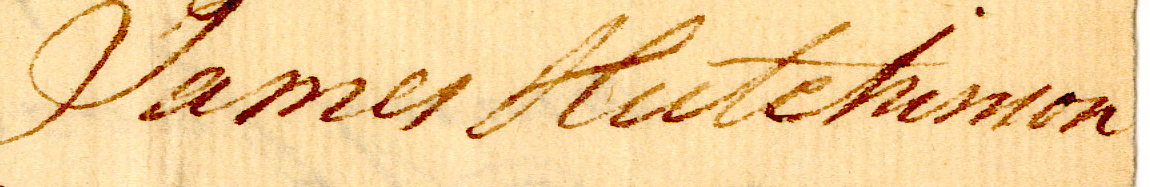James Hutchinson
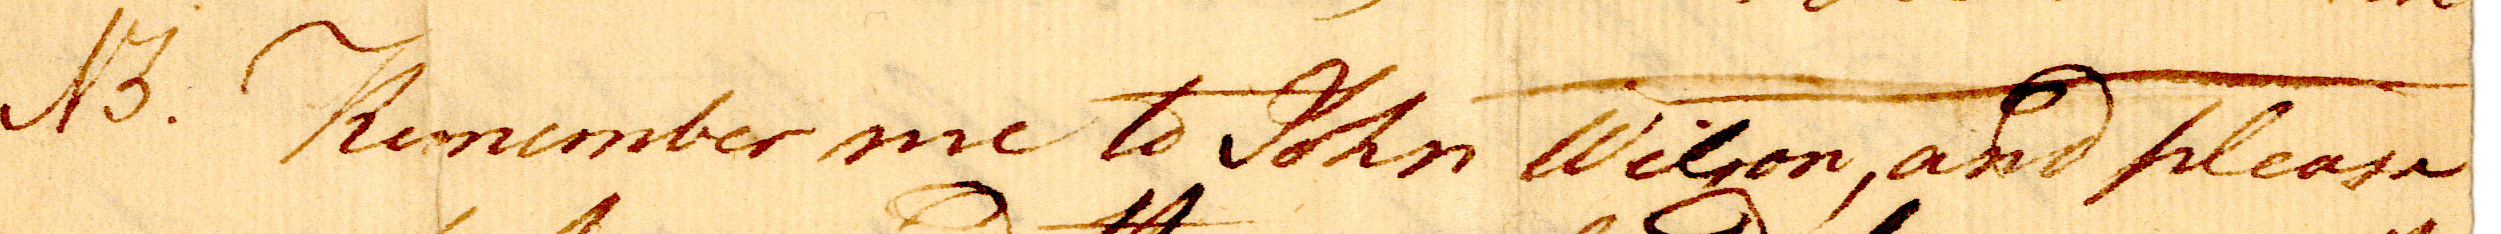NB. Remember me to John Wilson, and please
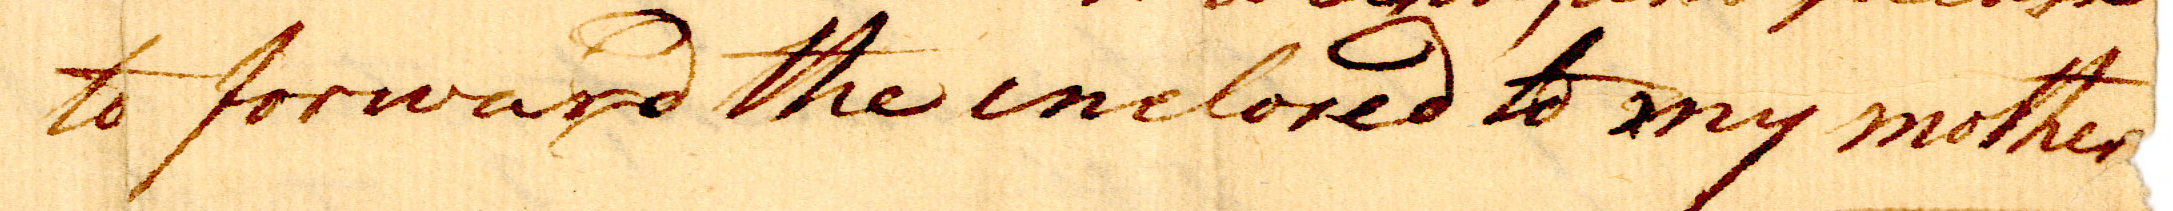to forward the enclosed to my mother
